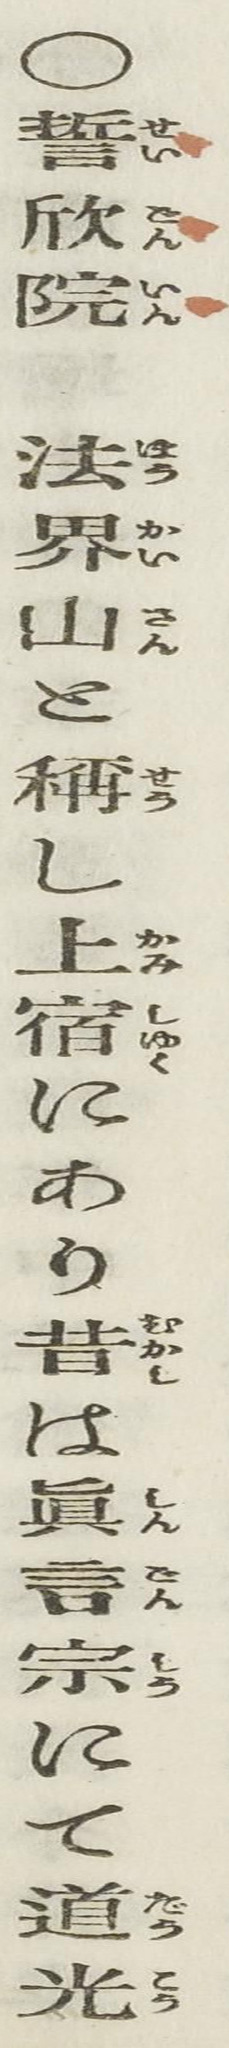○誓欣院法界山と称し上宿にあり昔は眞言宗にて道光
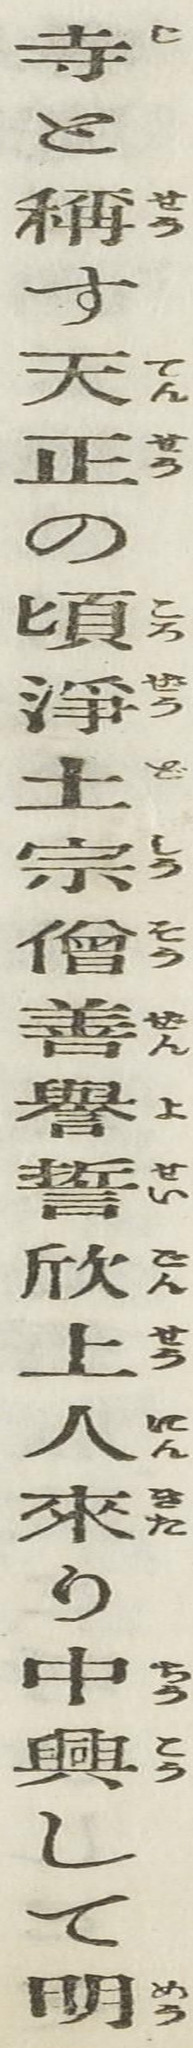寺と称す天正の頃浄土宗僧善譽誓欣上人来り中興して明

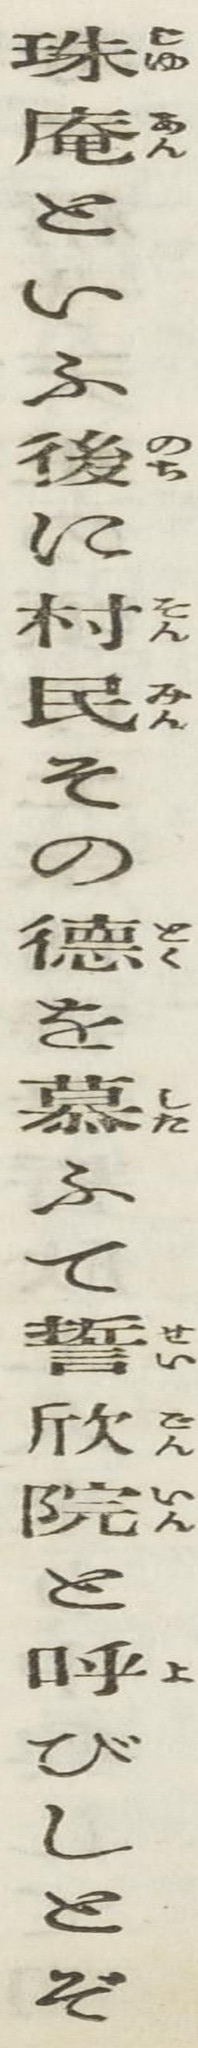珠庵といふ後に村民その徳を慕ふて誓欣院と呼びしとぞ
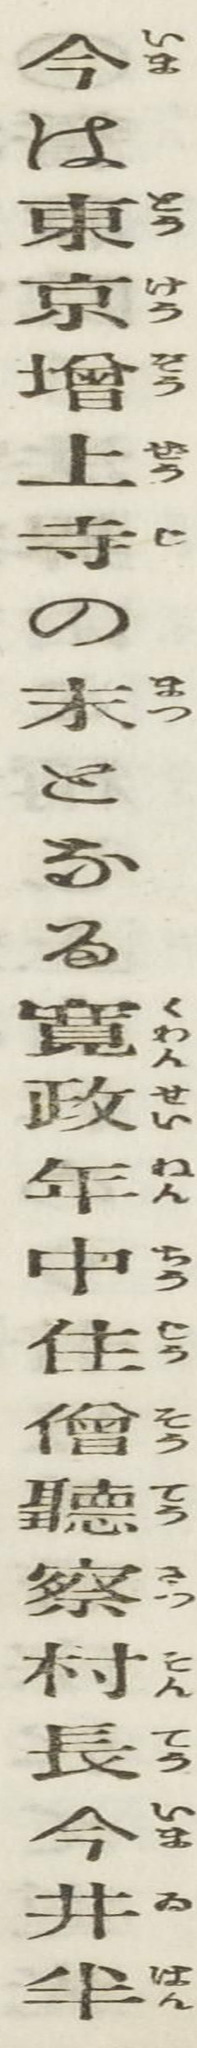今は東京増上寺の末となる寛政年中住僧聴察村長今井半
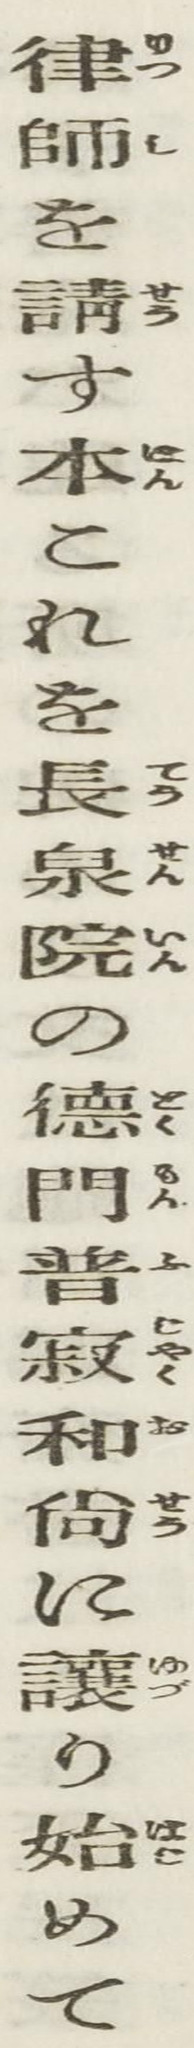律師を請す本これを長泉院の徳門普寂和尚に譲り始めて
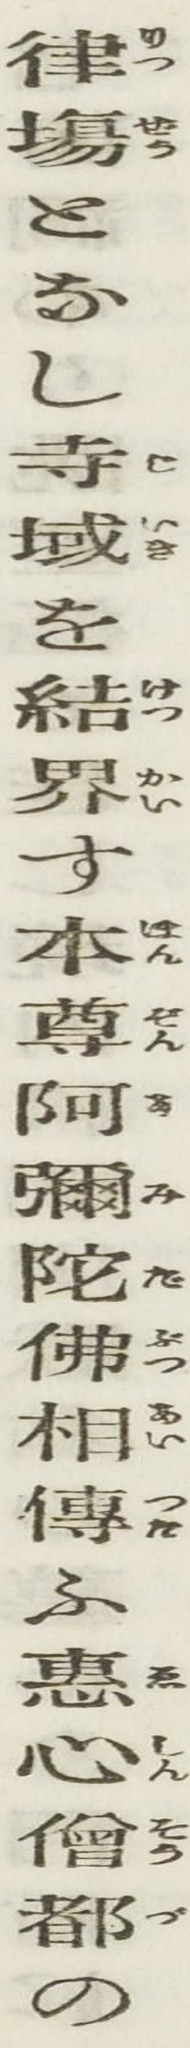律場となし寺域を結界す本尊阿弥陀仏相伝ふ恵心僧都の
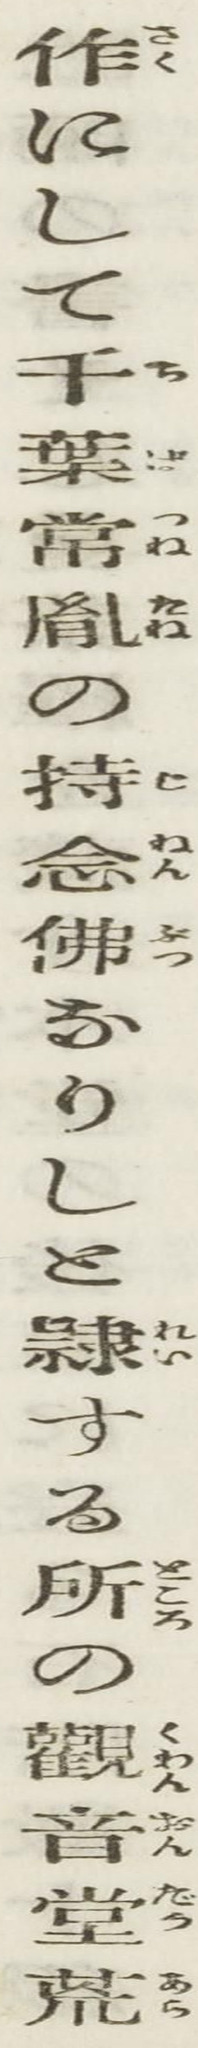作にし千葉常胤の持念仏なりしと隷する所の観音堂荒
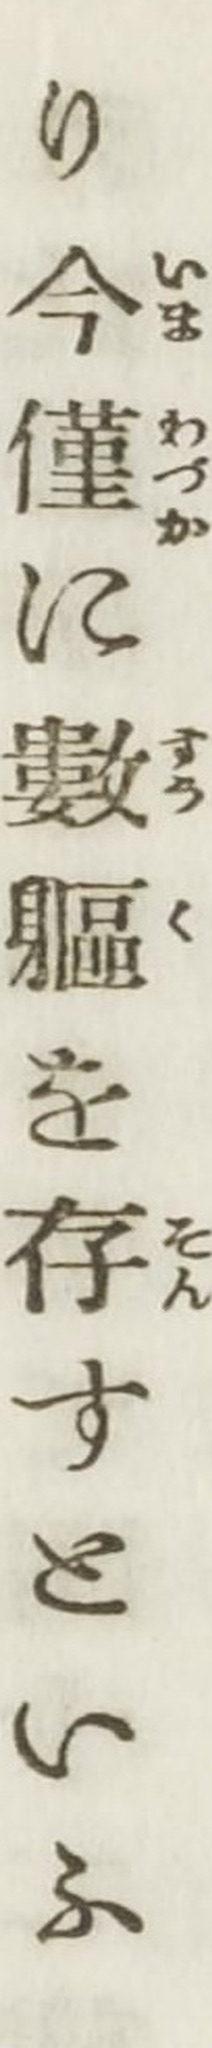り今僅に数躯を存すといふ
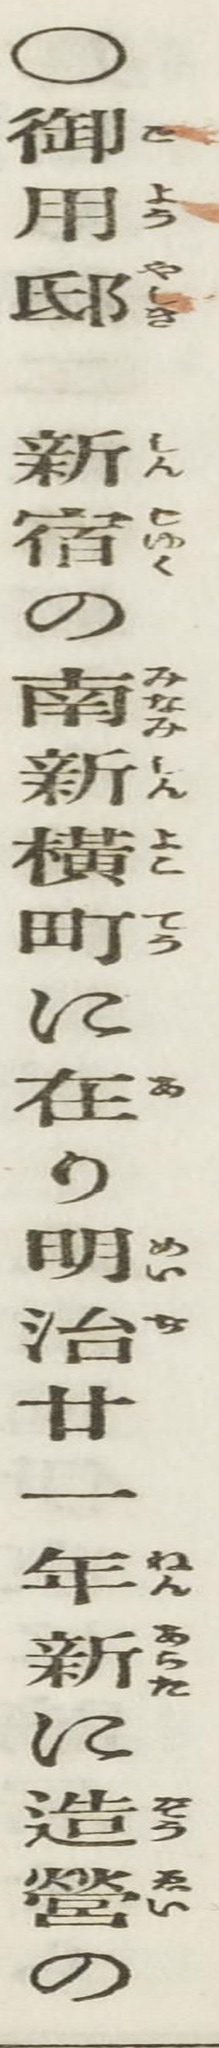○御用邸新宿の南新横町に在り明治廿一年新に造営の
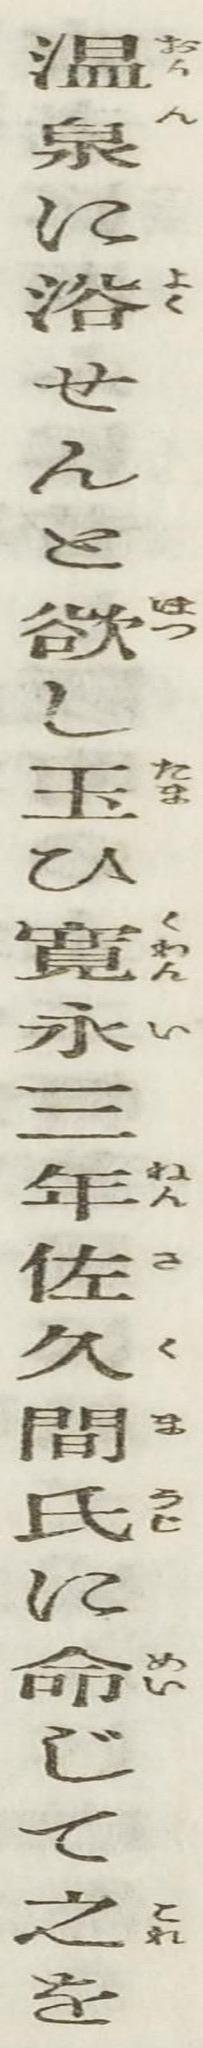温泉に浴せんと欲し玉ひ寛永三年佐久間氏に命じて之を
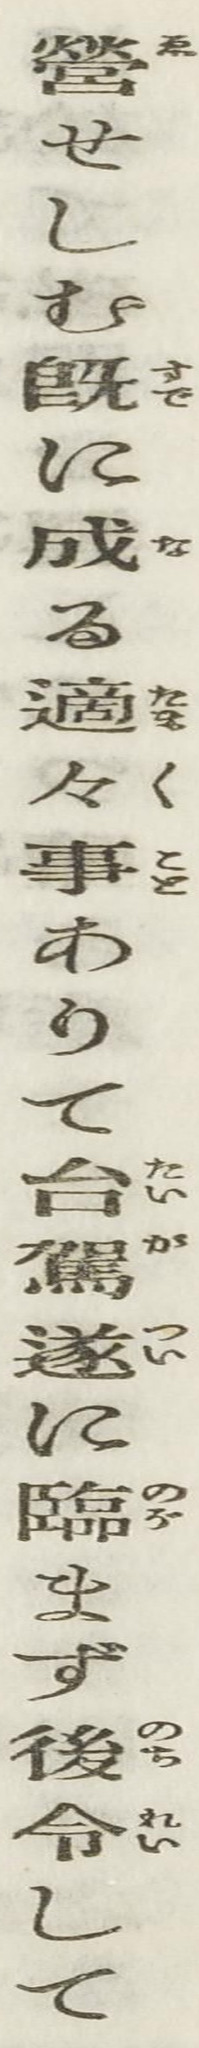営せしむ既に成る適々事ありて台駕遂に臨まず後令して
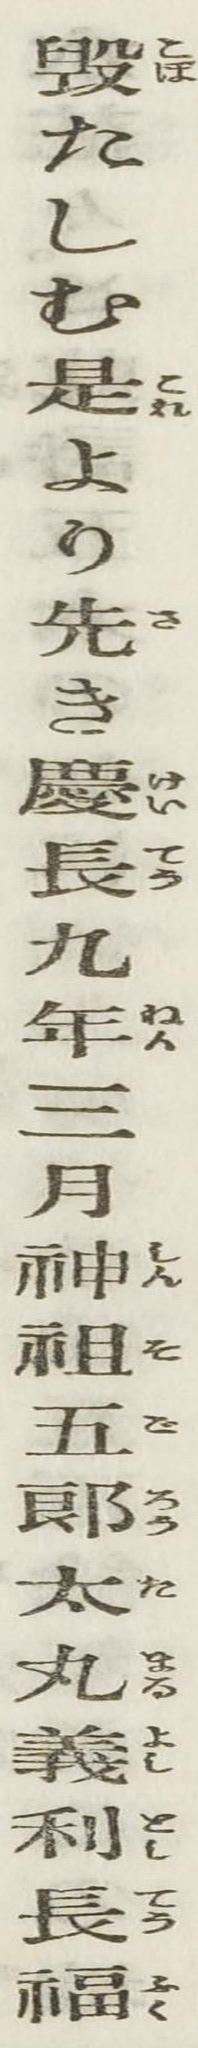毀たしむ是より先き慶長九年三月神祖五郎太丸義利長福
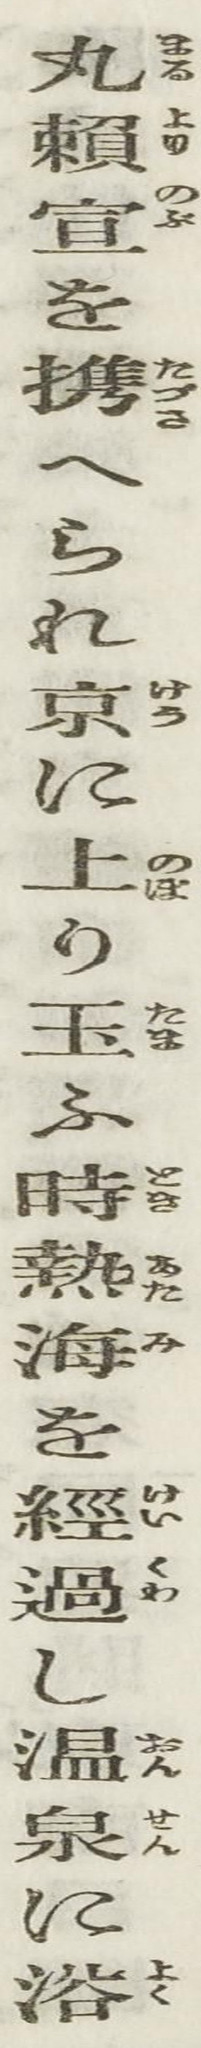丸頼宜を携へられ京に上り玉ふ時熱海を経過し温泉に浴
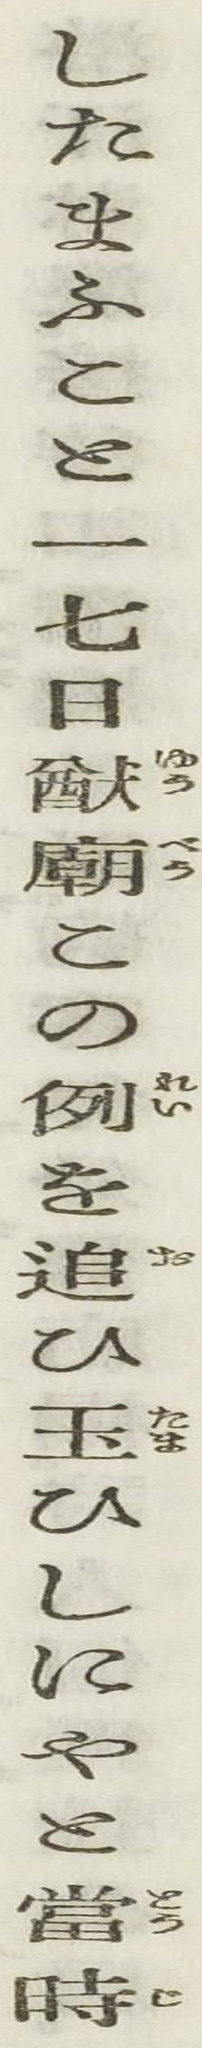したまふこと一七日猷廟この例を追ひ玉ひしにやと当時
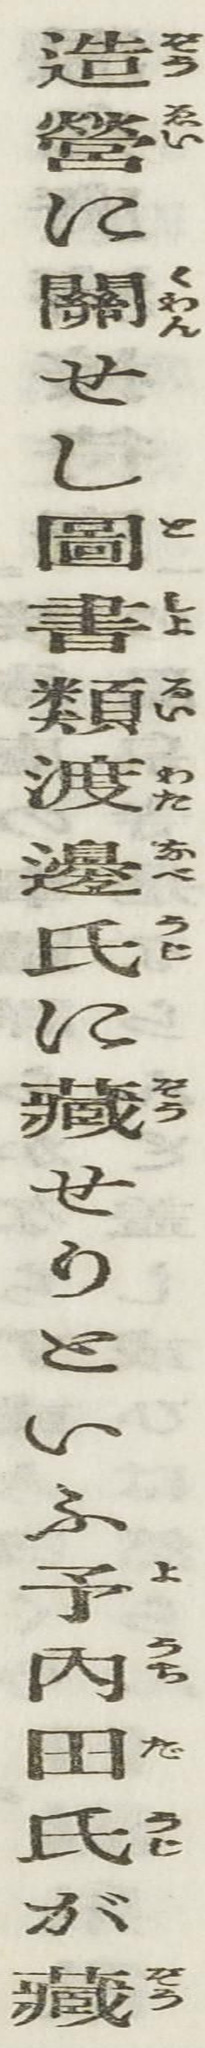造営に関せし図書類渡邊氏に蔵せりといふ予内田氏が蔵
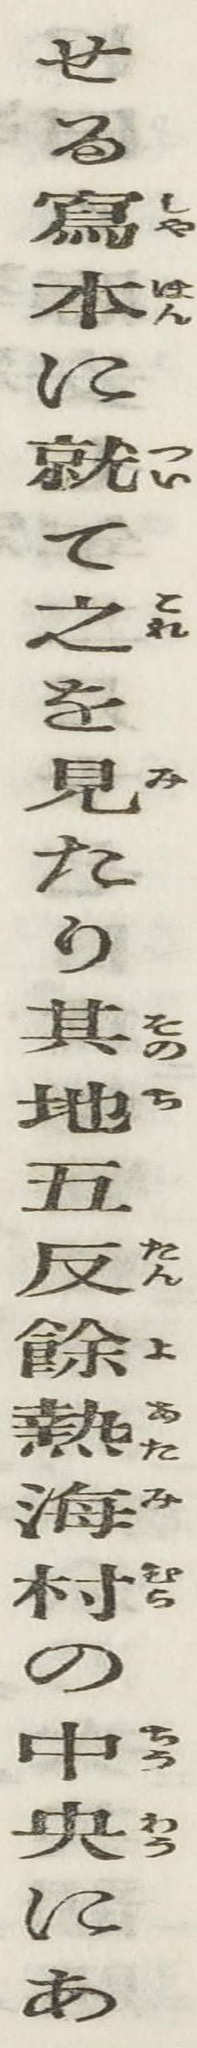せる写本に就て之を見たり其地五反餘熱海村の中央にあ
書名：熱海獨案内　全
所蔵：東京大学地震研究所図書室 Earthquake Research Institute Library, The University of Tokyo, JAPAN
